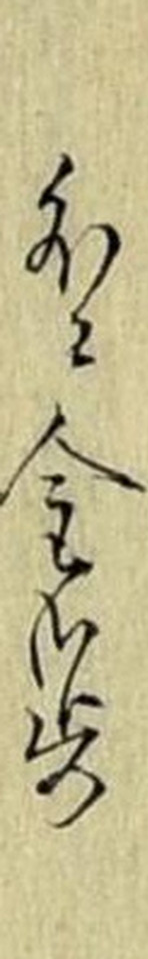外に金弐歩
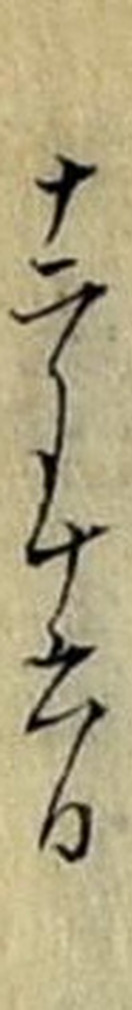十二月十六日

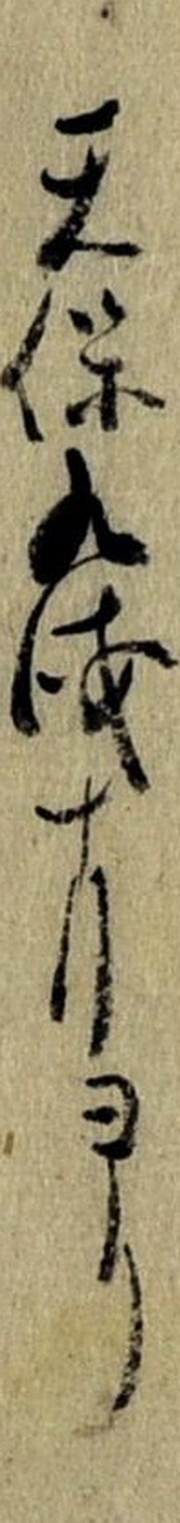天保九戌十月より
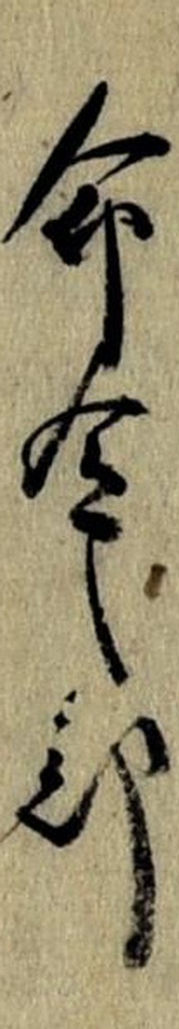命令之部
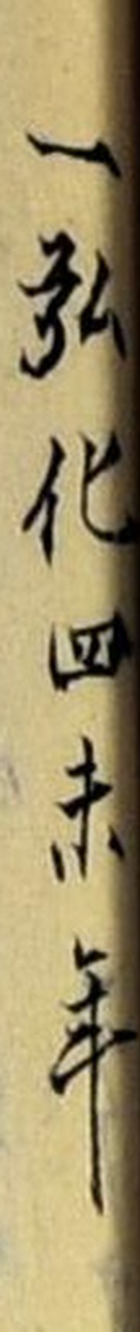一弘化四未年
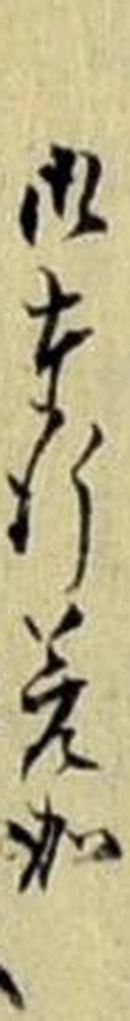御奉行差加
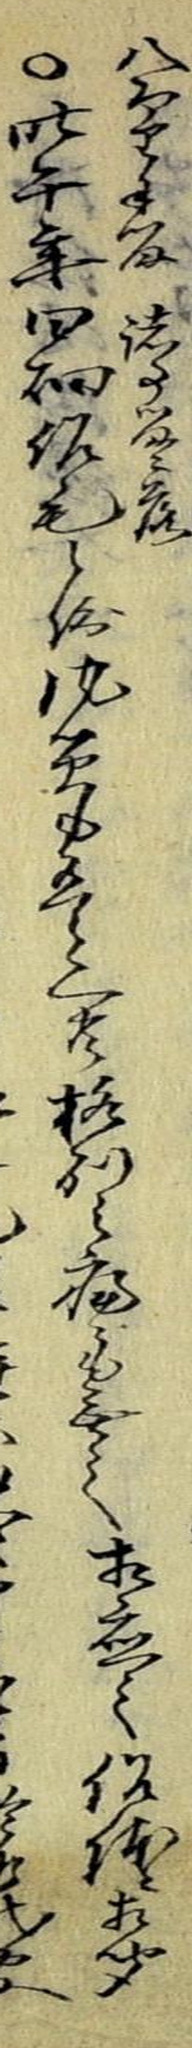○昨午年田畑作毛之儀作災も有之候へ共格別之痛も無之相応之作体に相聞
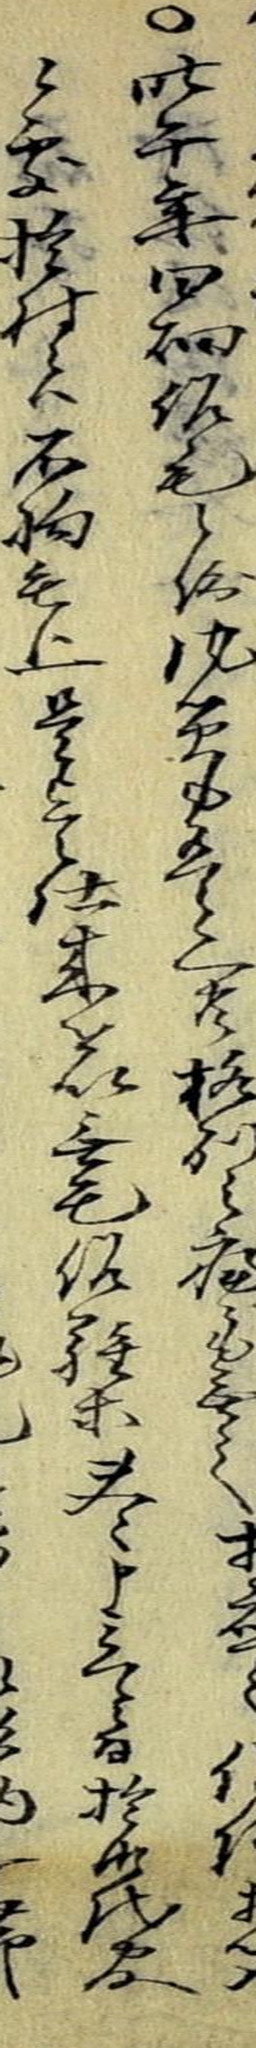候処於村々は不拘毛上是迄之仕来を以無毛作難等夫々申立候に付於御代官
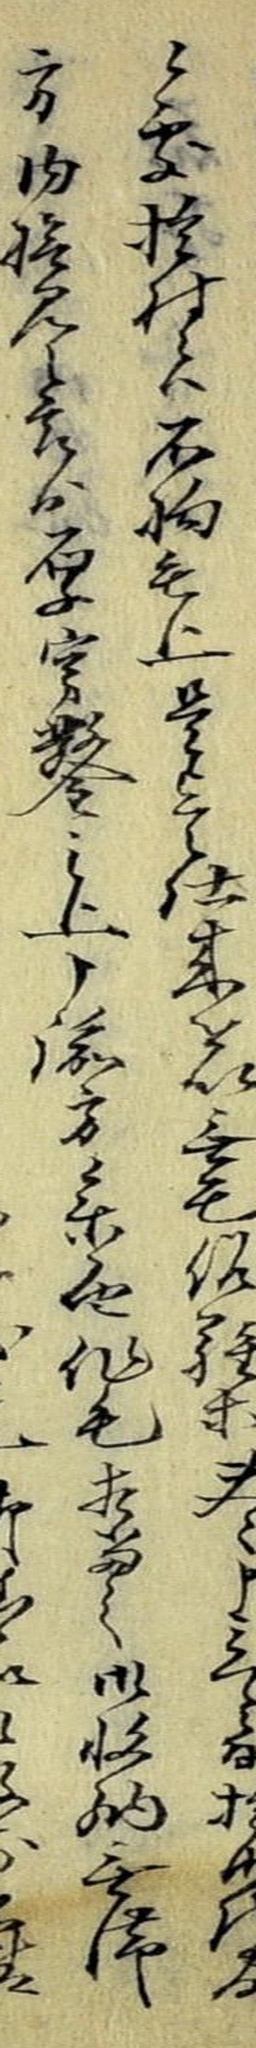方内検見之節ゟ厚穿鑿之上申添方参候由作毛相当之御収納無滞
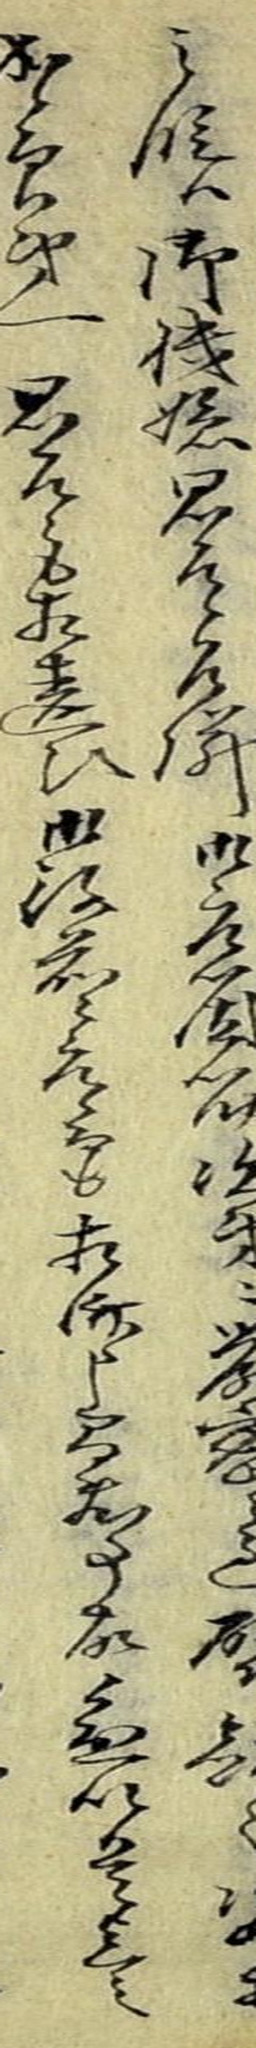成候而は第一思召にも相違ひ御役前に取候而も相済申間敷事故愈以是迄之
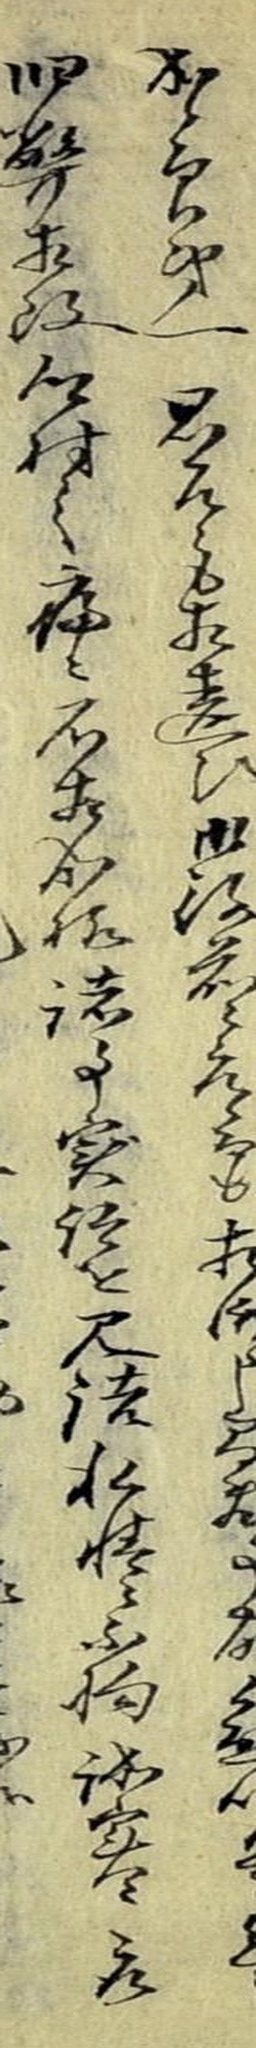旧弊相改郷村之痛に不相成様諸事実証を見詰私情に不拘誠実に取
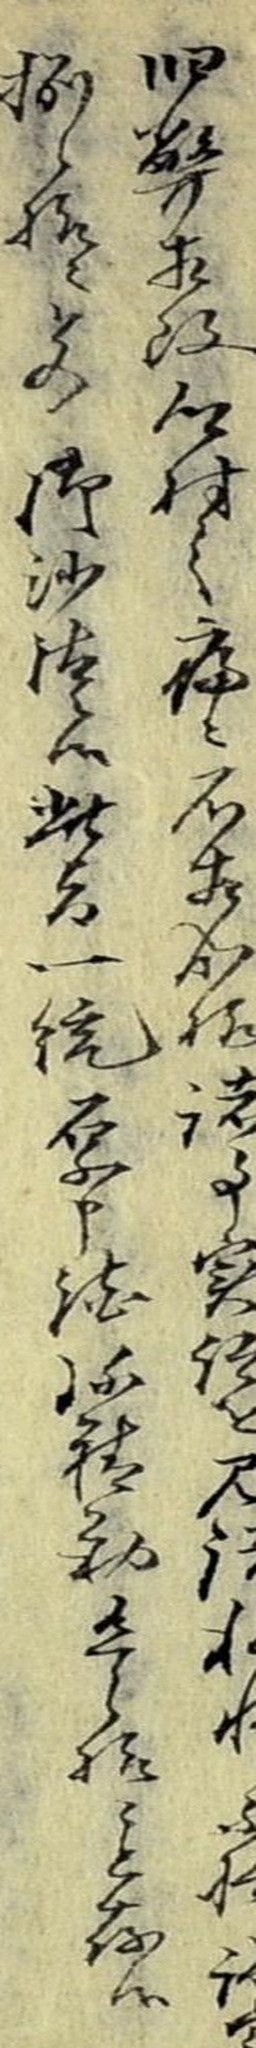捌候様にとの御沙汰に候此旨一統厚申談弥精勤有之様にと存候
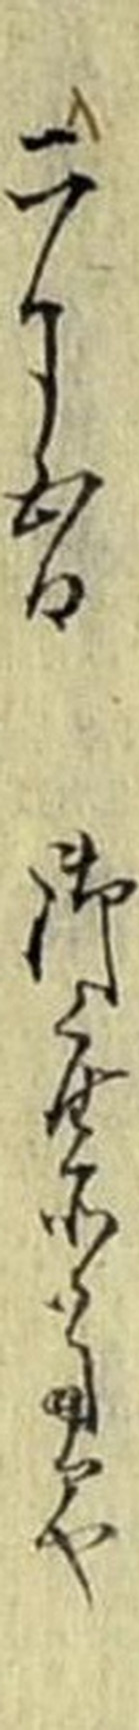二月五日御座所御用部や
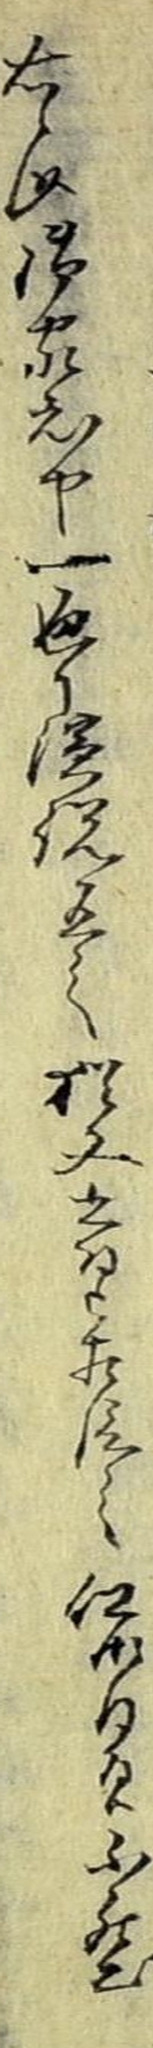右之趣御家老中一通之演説有之猶又書付被相渡之但御目付は不罷出

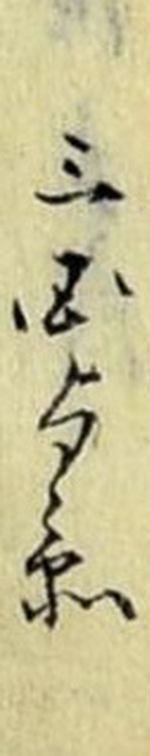三国与兵衛
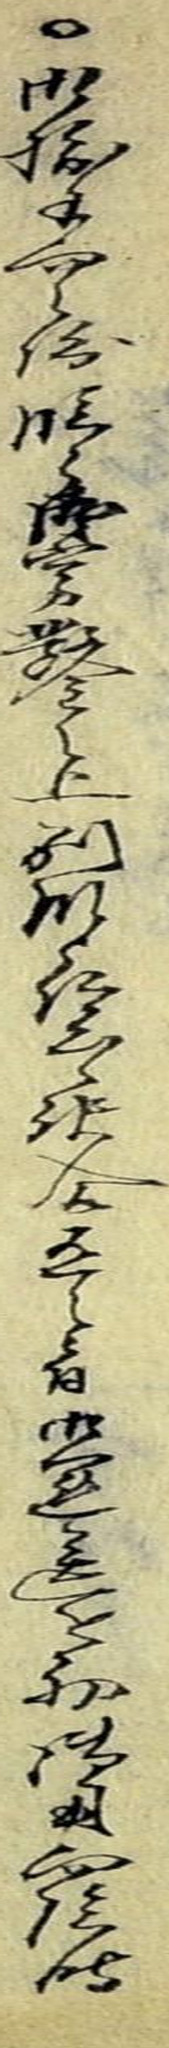○御勝手向之儀段々御穿鑿之上別段被仰出候訳合有之に付御運送を初御用向臨時
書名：命令之部 六
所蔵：福井県文書館 Fukui Prefectural Archives
